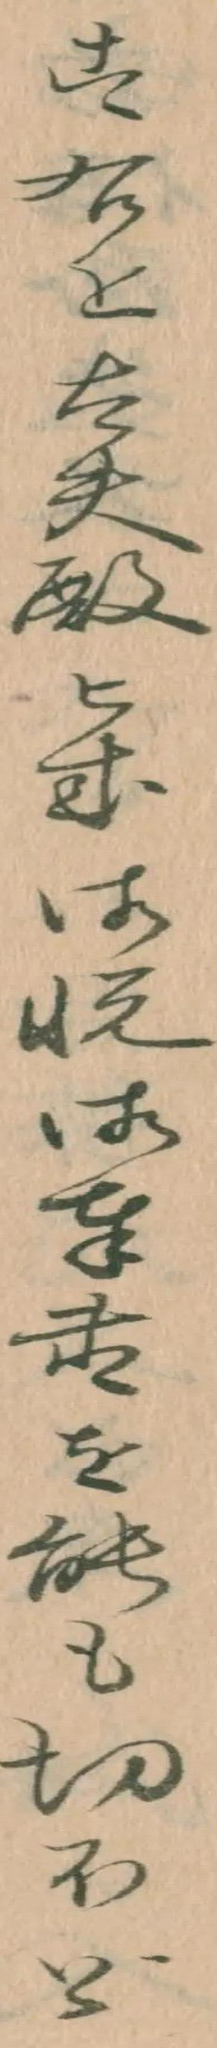春右近太夫殿被成御悦御奉書を能も切不ど
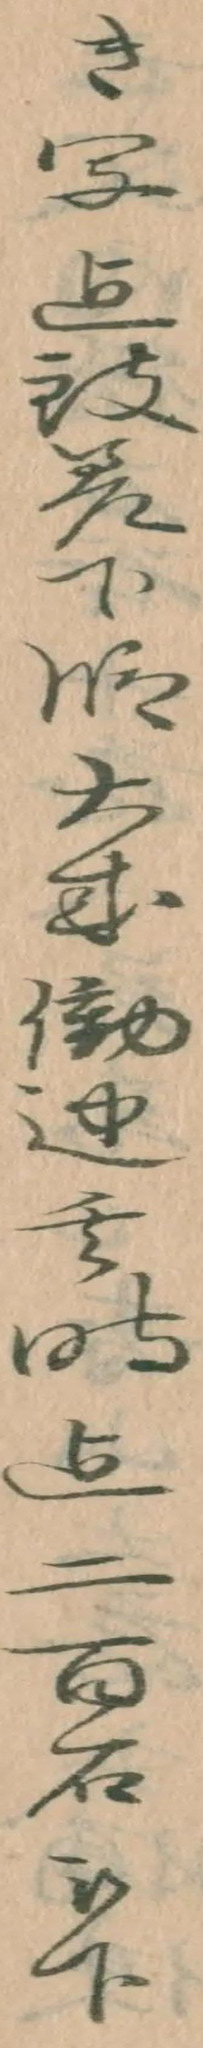き写迄致差下段大成働迚其時迄二百石被下
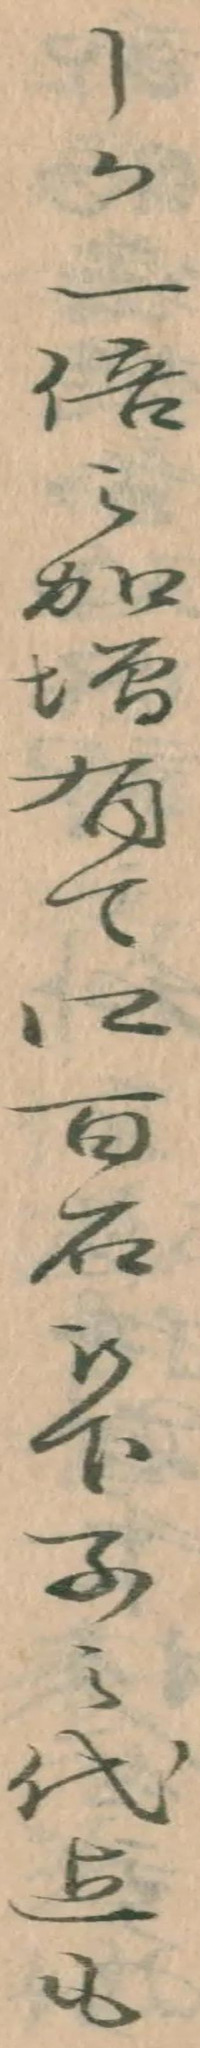しか一倍之加増有て四百石被下子之代迄も
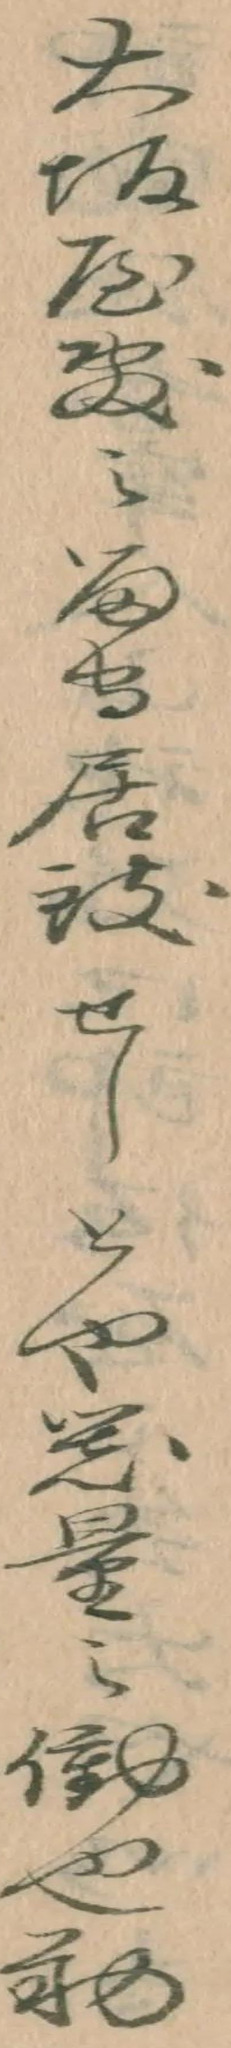大坂屋敷之留守居致せしとや器量之働也勤
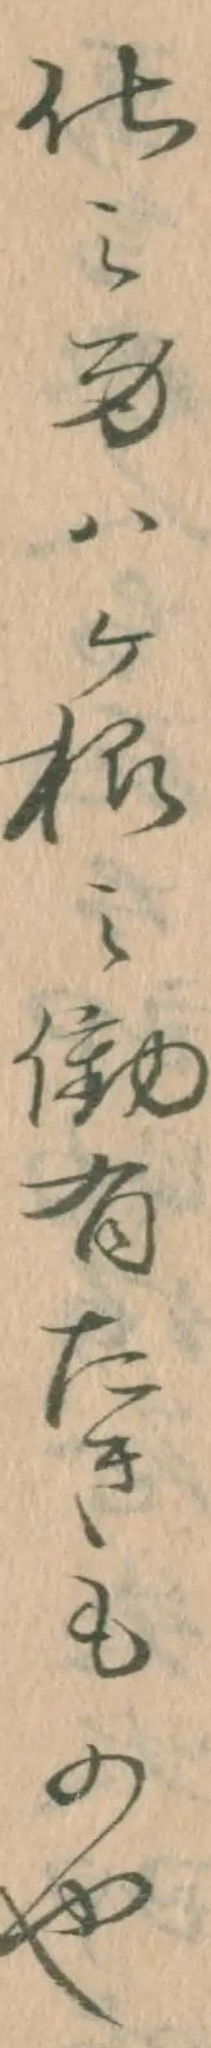仕之身はか様之働有たきもの也
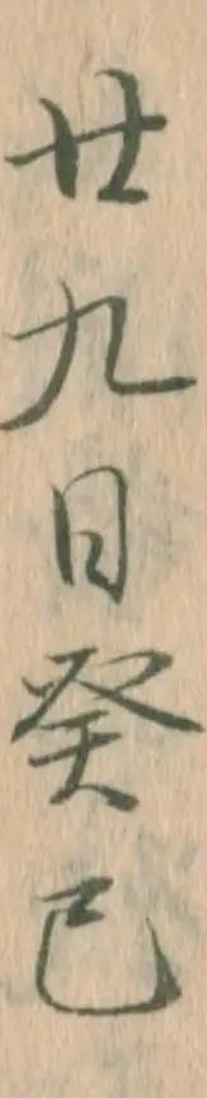廿九日癸巳
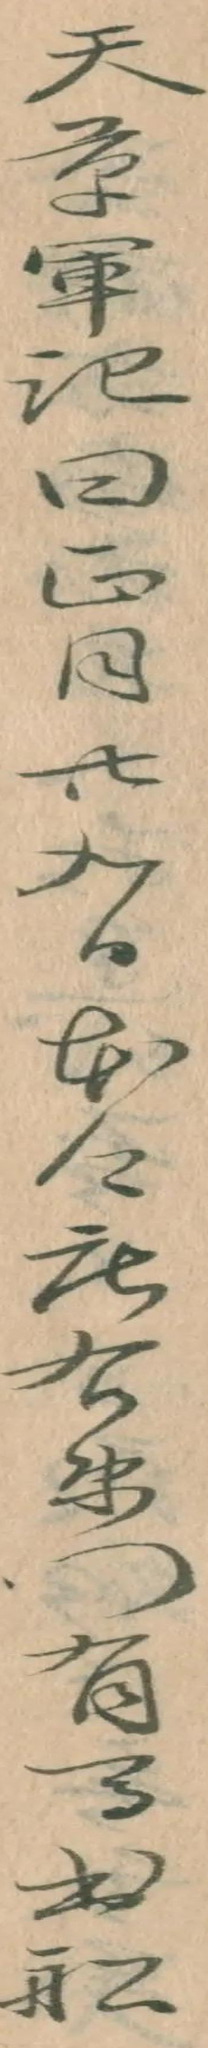天草軍記曰正月廿九日本郷庄右衛門有馬出舩
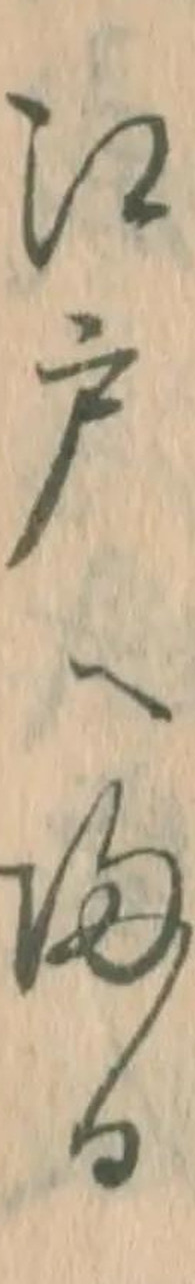江戸へ帰る
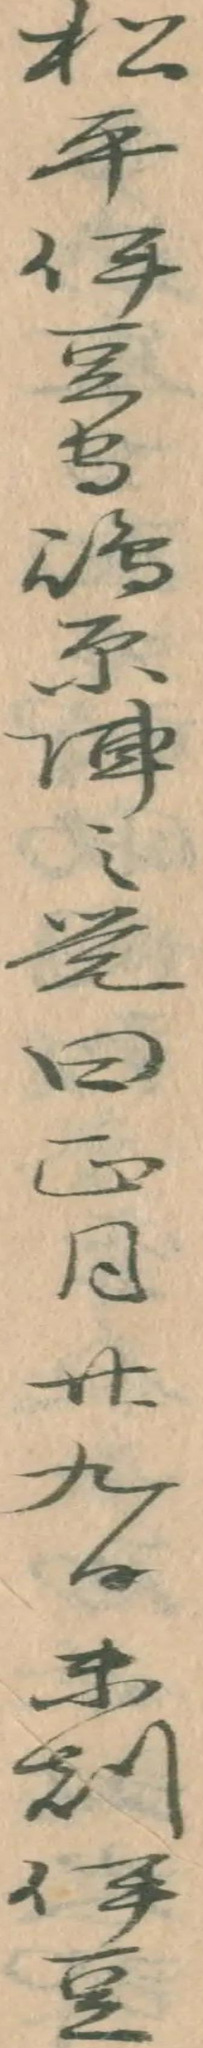松平伊豆守島原陣之覚曰正月廿九日未刻伊豆

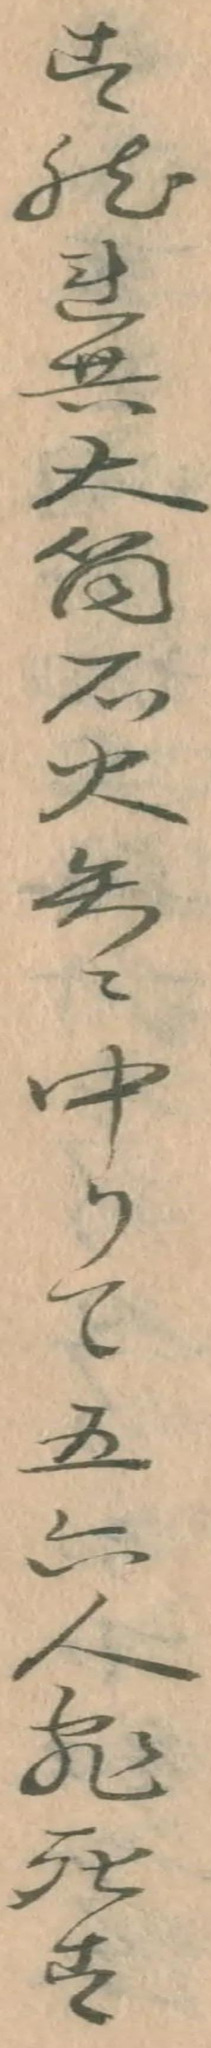春然連共大筒石火矢に中りて五六人究死春
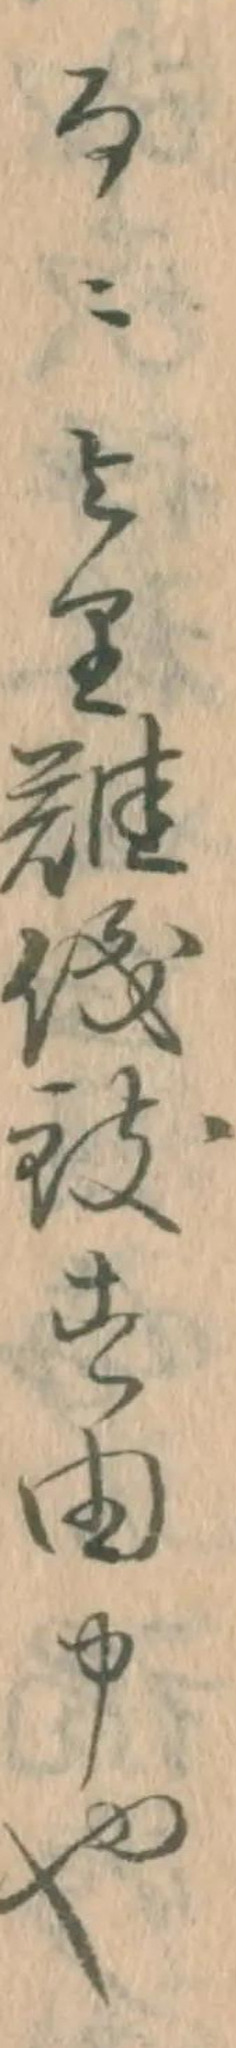るに与里難儀致春由申也
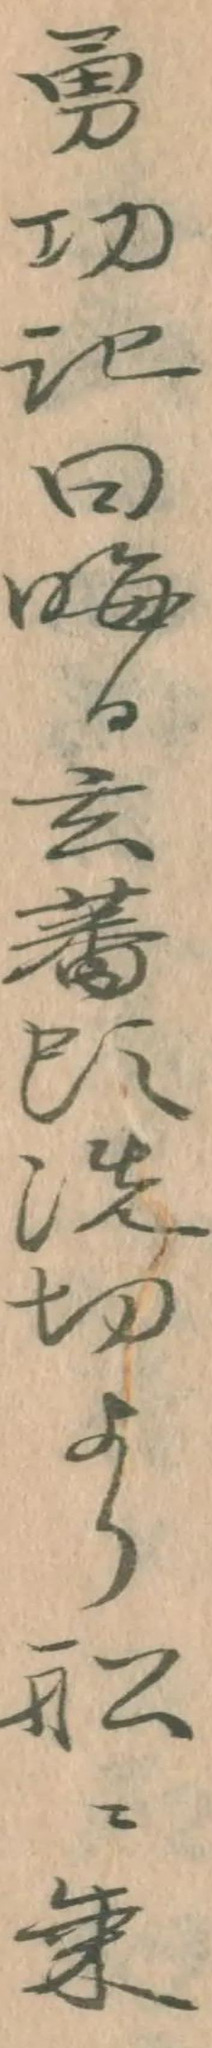勇功記曰晦日玄蕃頭洗切より舩に乗
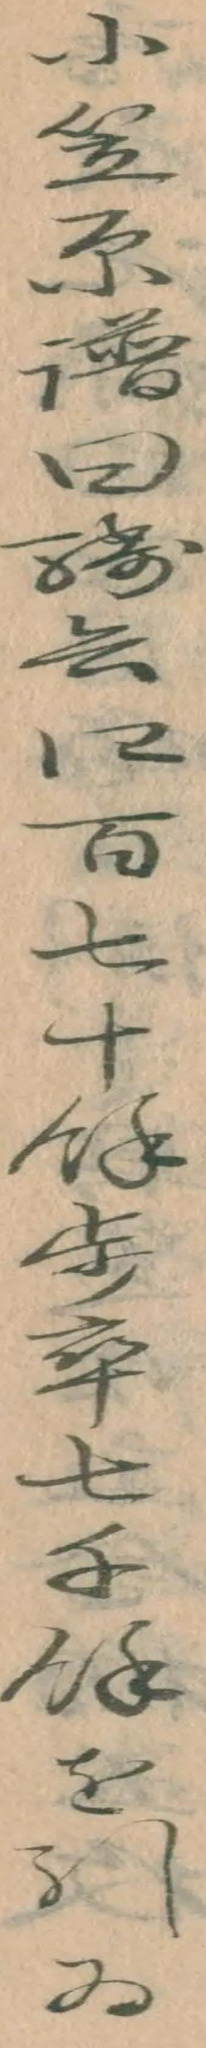小笠原譜曰騎兵四百七十余歩卒七千余を引ゐ
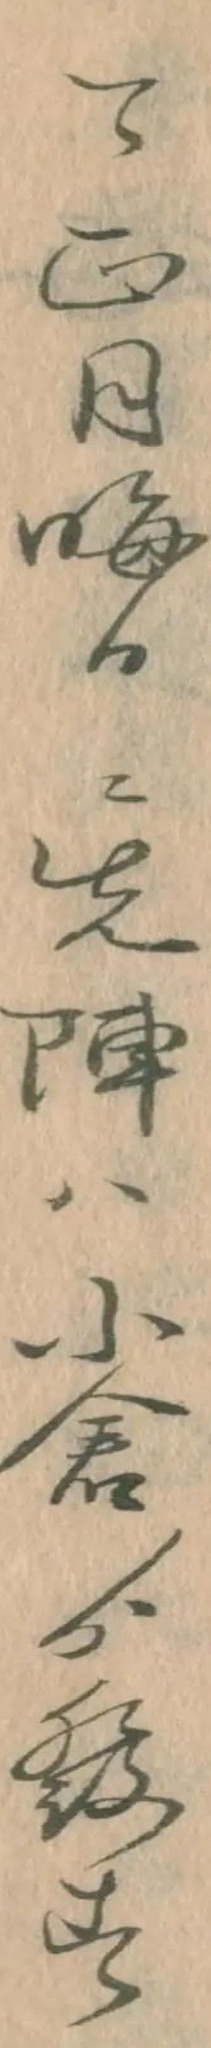て正月晦日に先陣は小倉ゟ発春

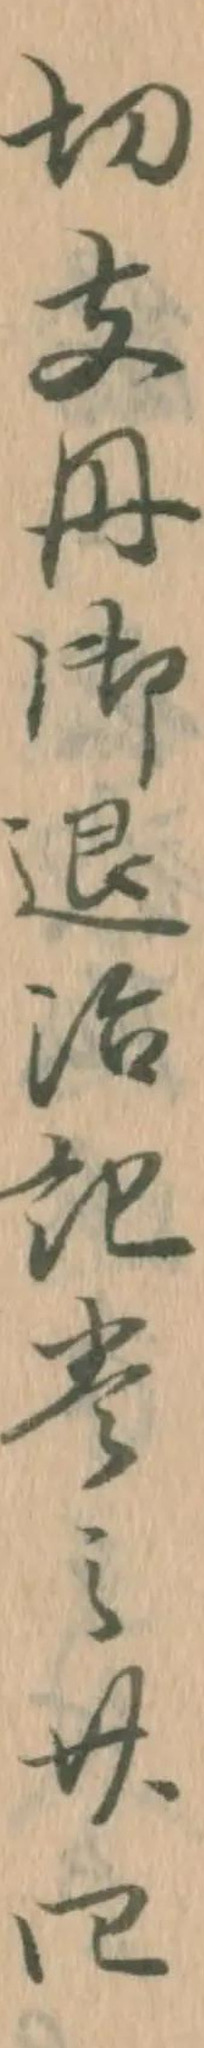切支丹御退治記巻之廿四
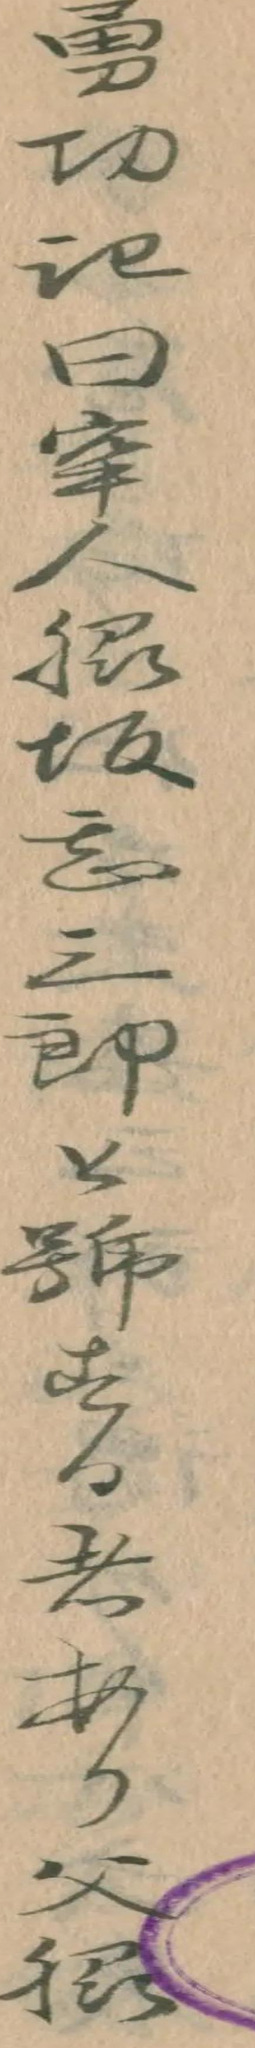勇功記曰牢人脇坂甚三郎と號春る者あり父脇
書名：切支丹御退治記 49巻. [6]
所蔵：国立国会図書館 National Diet Library, JAPAN
